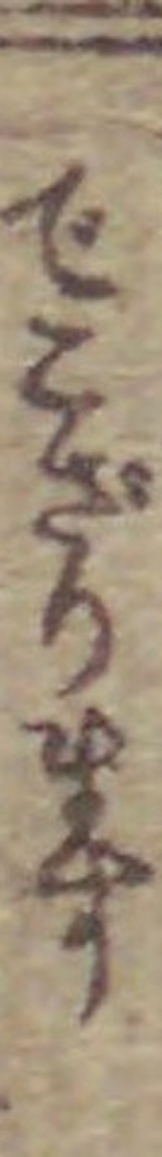でこざります
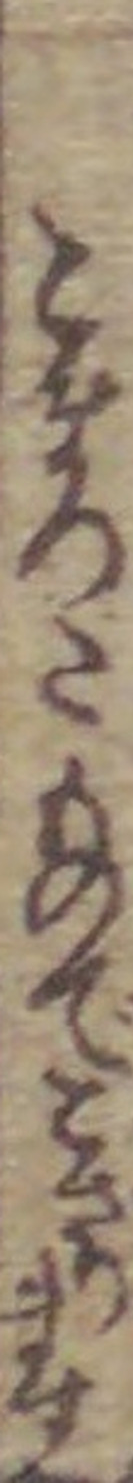こまつたものでござります

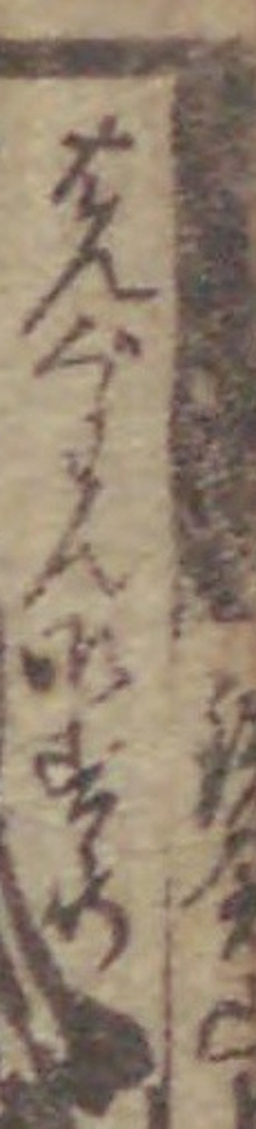はんぐわん御すゝめ
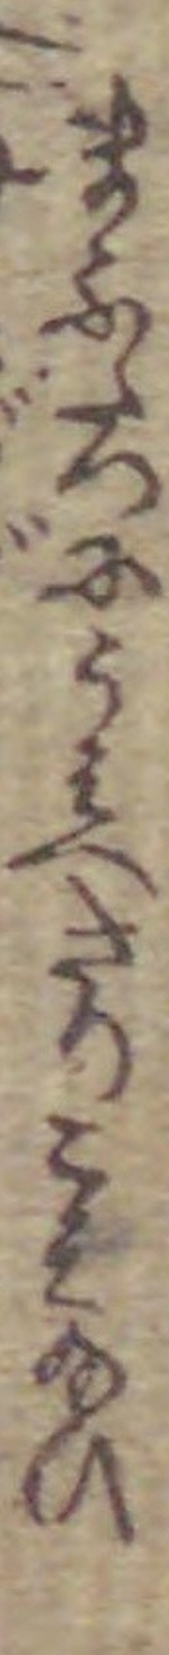まふたつにうみへきりこみ給ひ
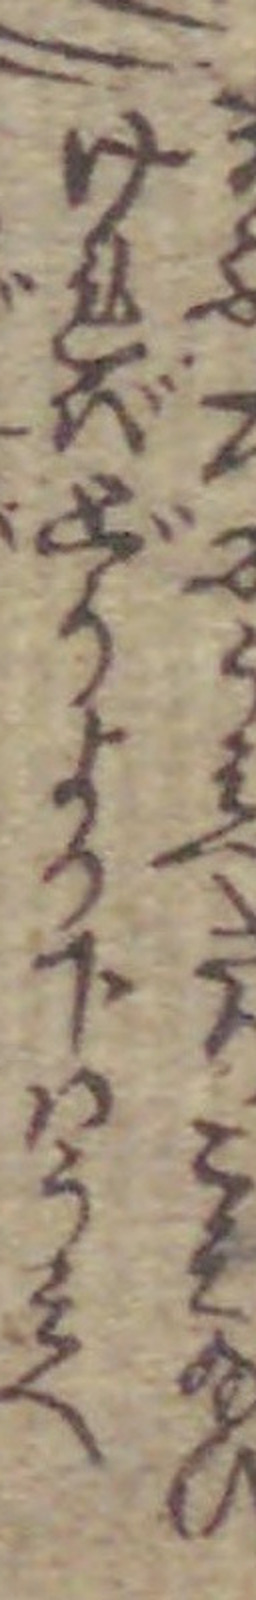ければどうより下はうみへ
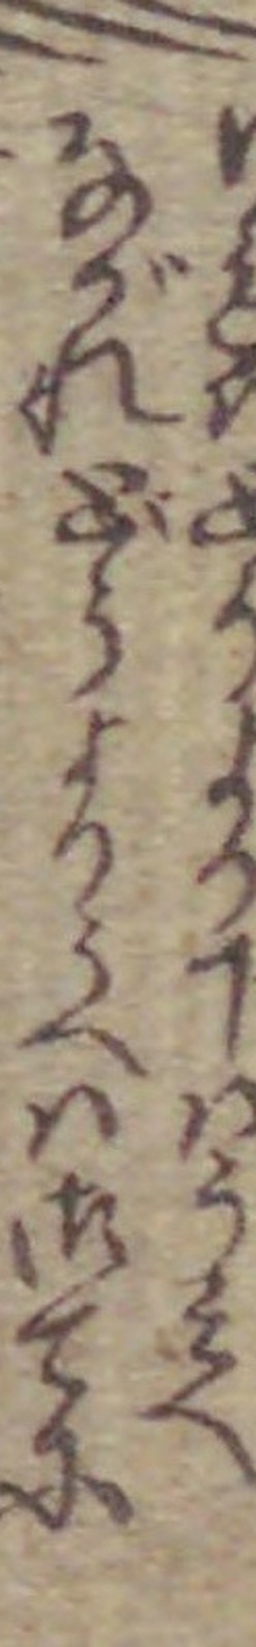ながれどうよりうへは御てに
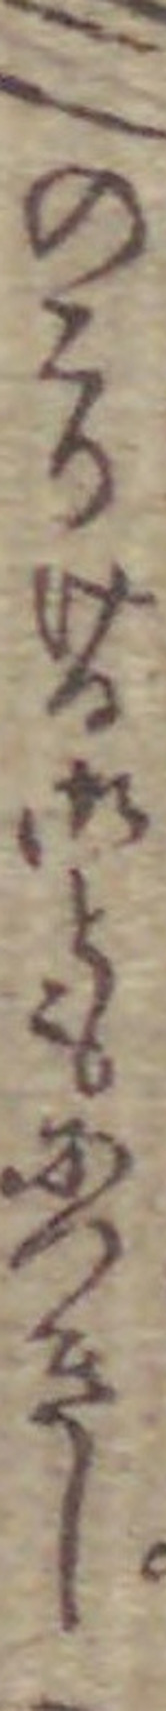のこりける御ともにつきし
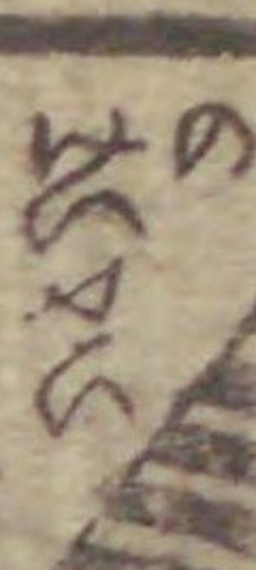けいせい
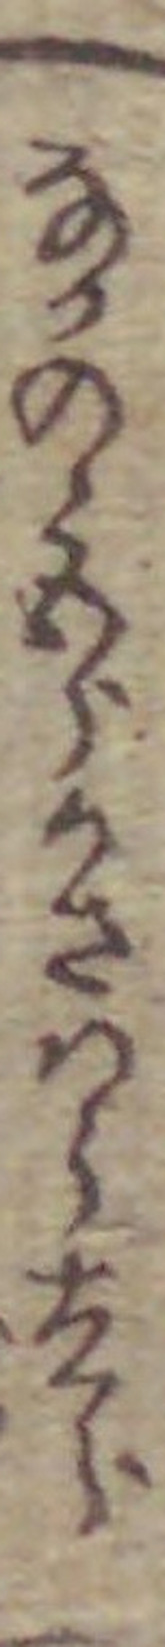なかのゝ五郎かさはら太郎
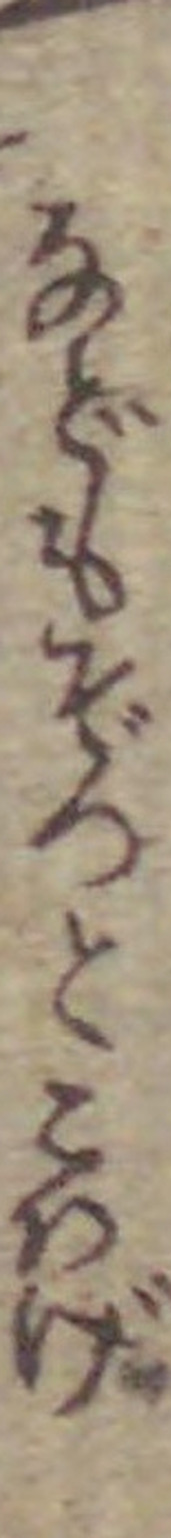などもぞつとこはげ
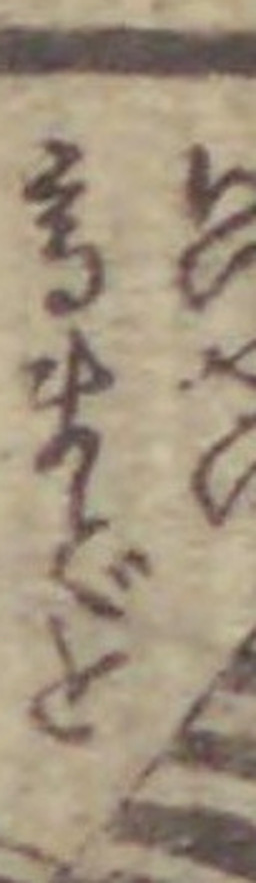高まどを
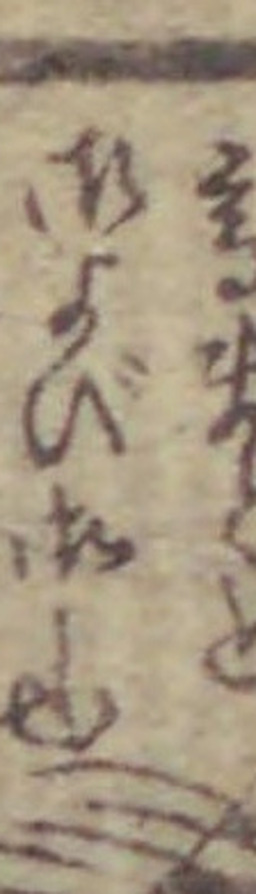御よび御しゆ
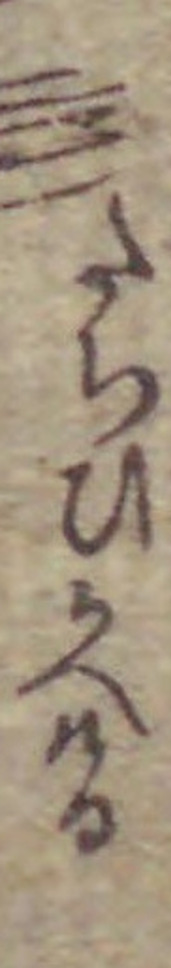たちひかへける
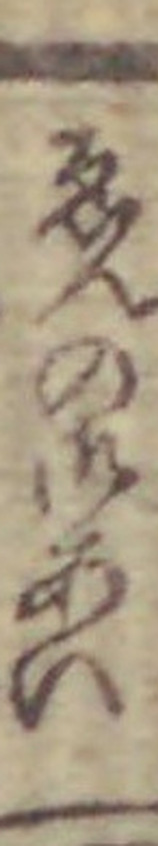ゑんの御あい
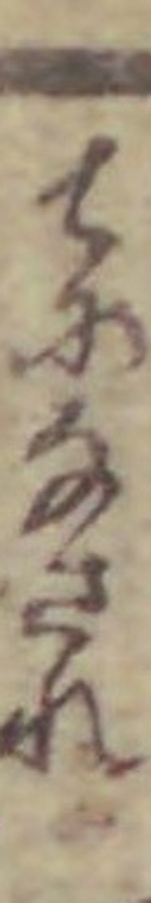てになされ
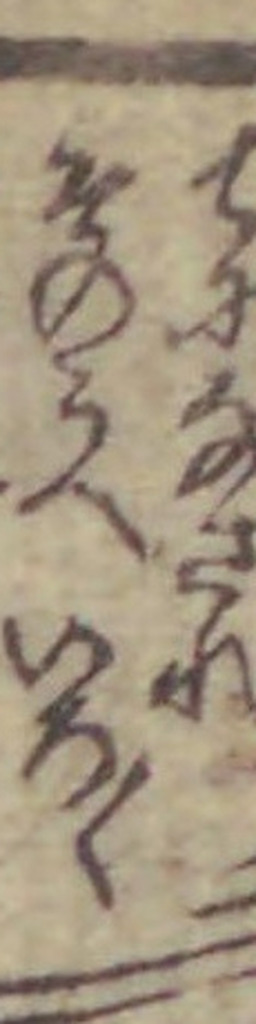そのうへいろ〳〵
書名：鎌倉山紅葉浮名
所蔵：国立国会図書館 National Diet Library, JAPAN
